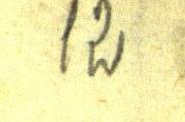12
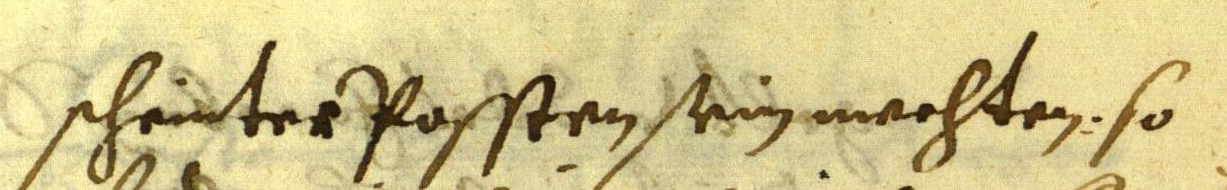scheinter Possten sein mechten. so
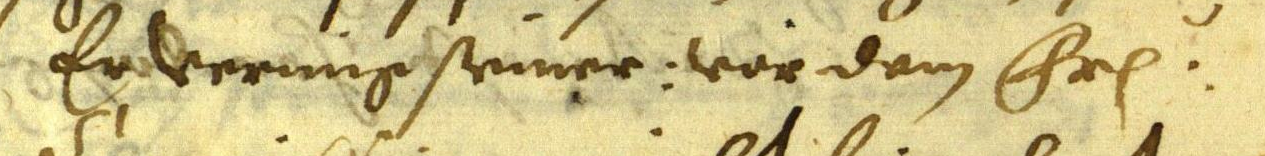Er vermig seiner. vor dem Frl:
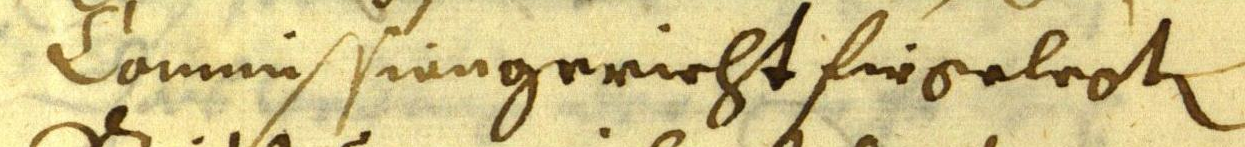Commissiongericht für gelegt
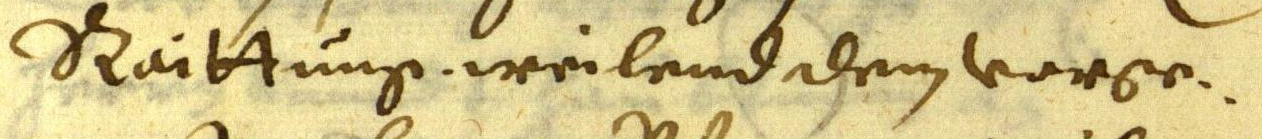Raittūng. weilend dem verge¬
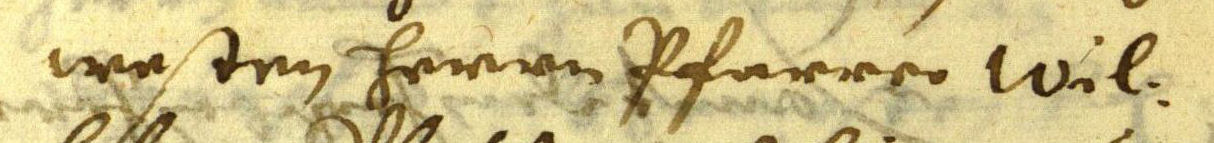westen Herrn Pfarrer Wil¬
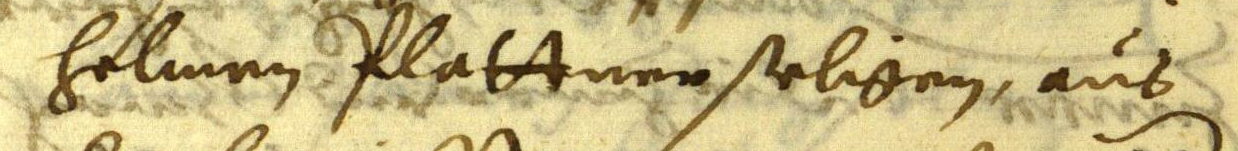helmen Plattner seligen, aūs
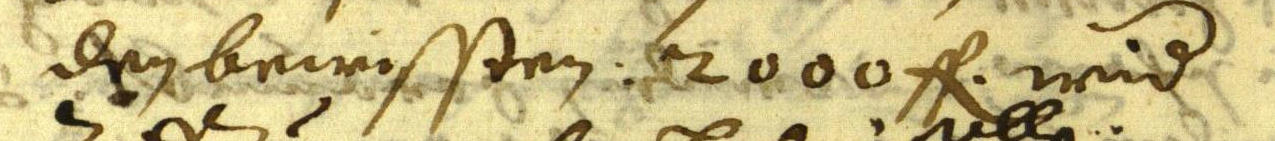den bewissten: 2000 fl. wid
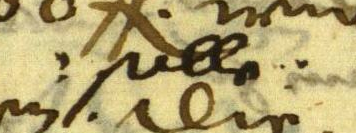:solle:
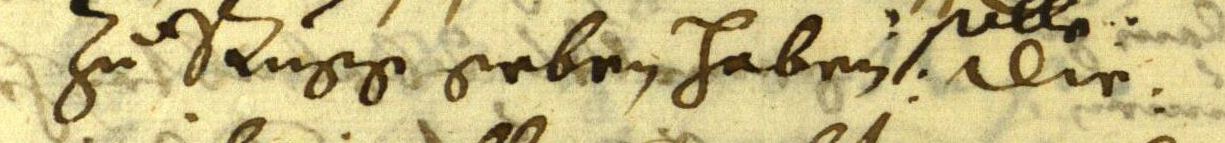Zū Rūgg geben haben: der¬
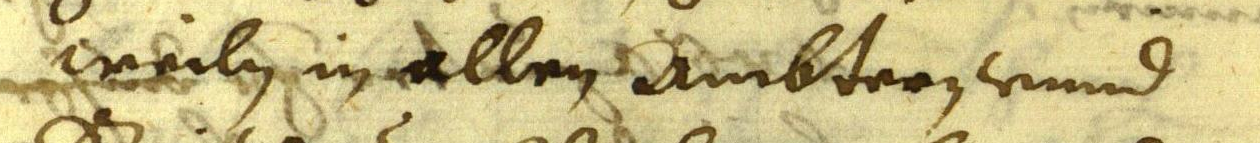weiln in allen Ambtern vnnd
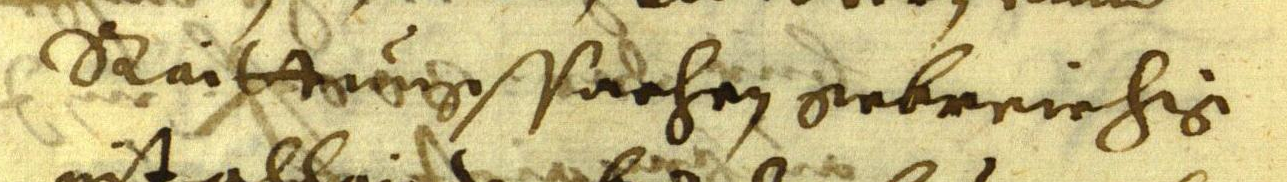Raittūngssachen gebreichig
